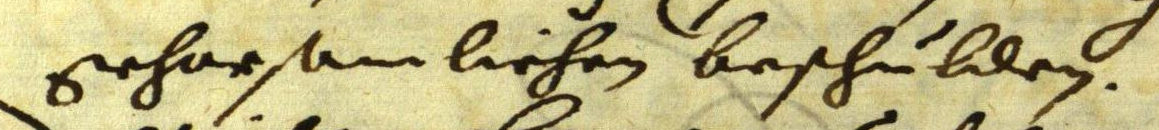gehorsamlichen beschūlden.
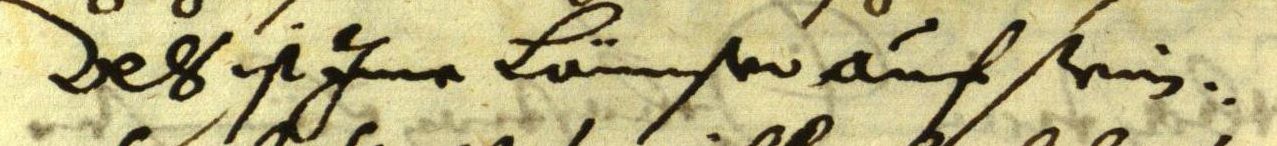Als ist Ime Lännser aūf sein:
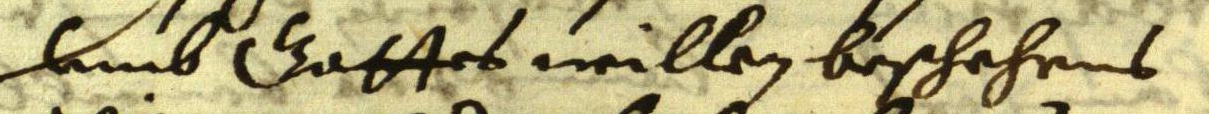umb Gottes willen beschehens
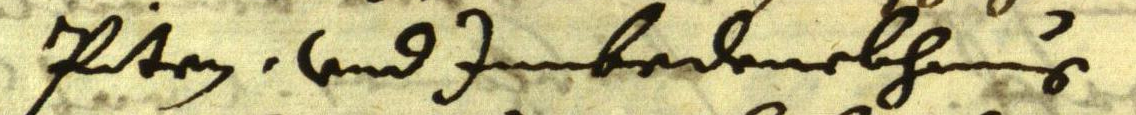Piten. vnd Innbedenckhūng
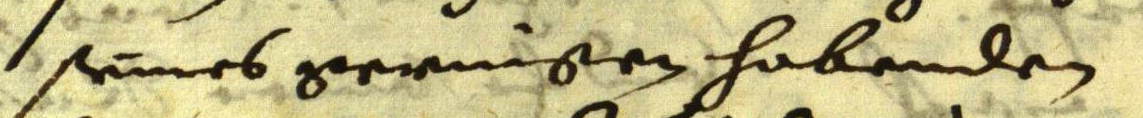seines geringen habenden
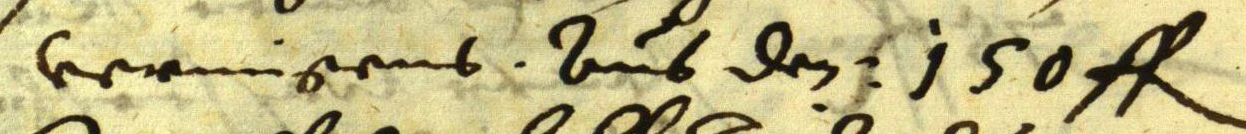vermigens. Aūs den: 150 fl
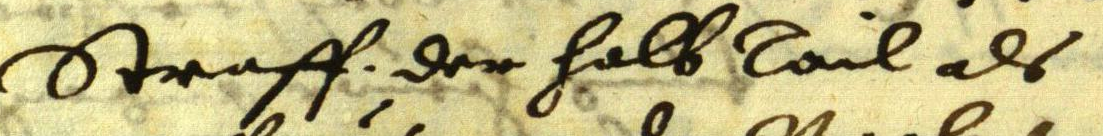Straff. der halb Tail als
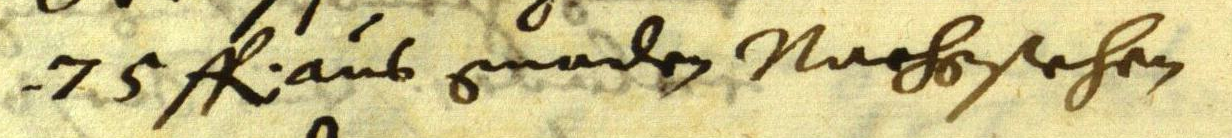75 fl. aūs gnaden Nachgsehen
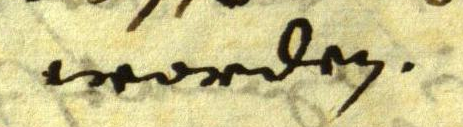worden.
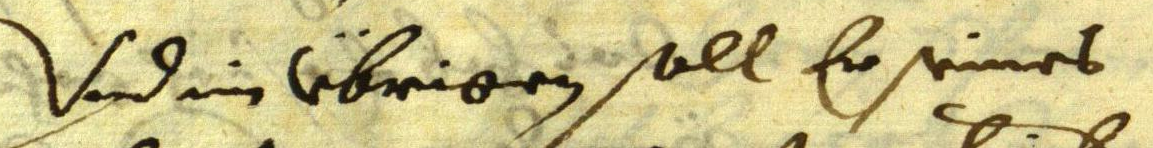Vnd im v̈brigen soll Er seines
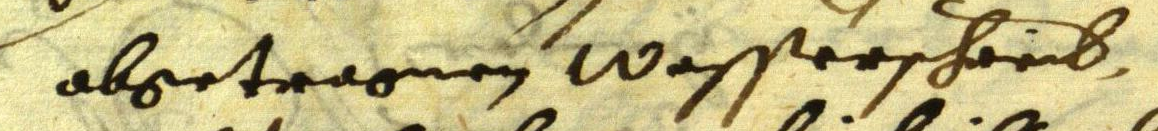abgetragnen Wasserschreib¬
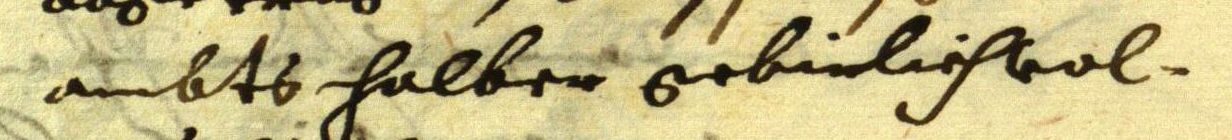ambts halber gebirlich vol¬
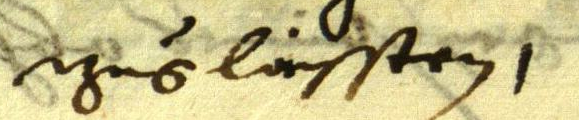zūg laissten,
